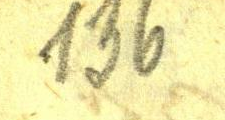136
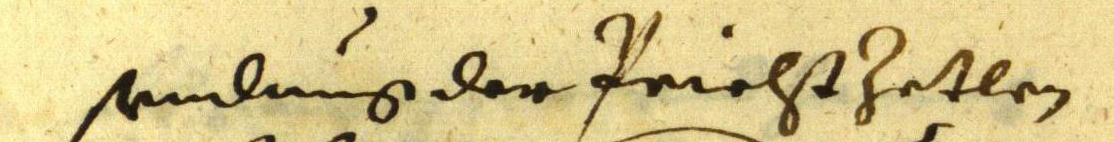sendūng der Peicht Zetlen
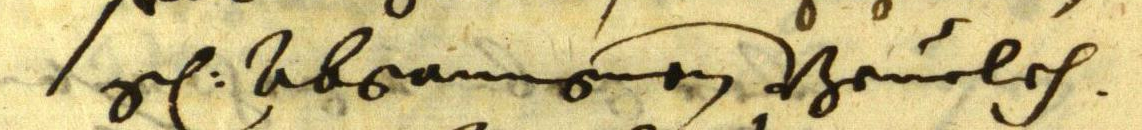g: abganngnen Beūelch.
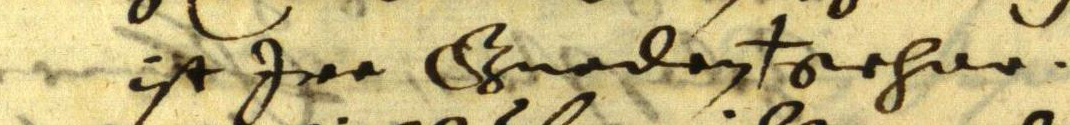ist Ire Gnaden gehor¬
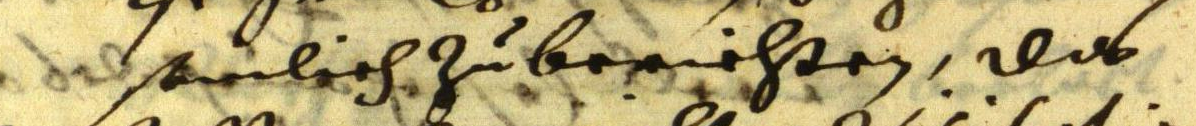samlich Zū berichten, das
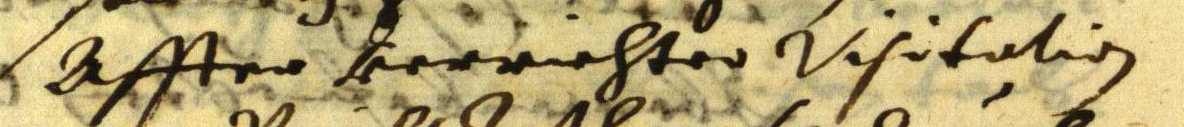Affter verrichter Visitation
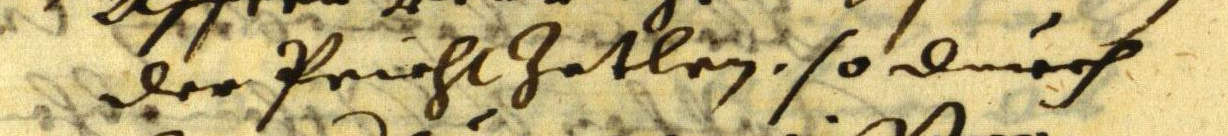der Peicht Zetlen. so dūrch
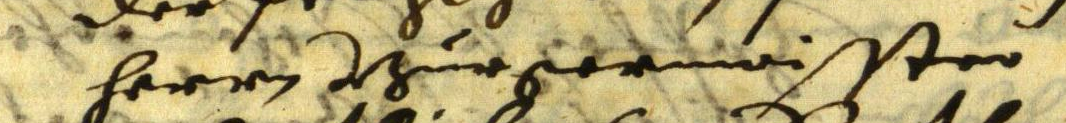herrn Būrgermaisster
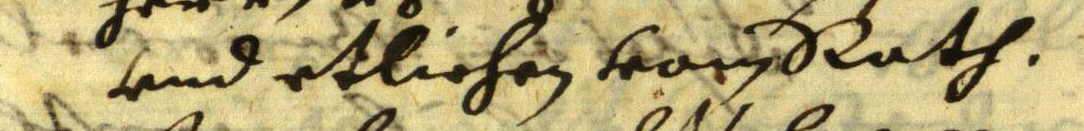vnd etlichen vom Rath.
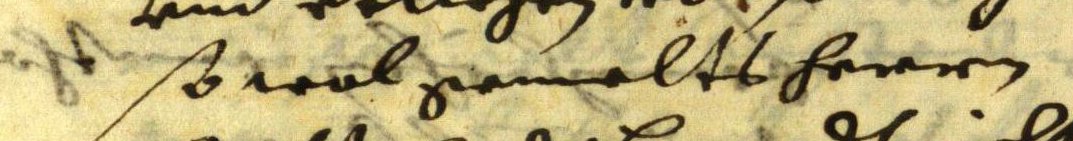so wol gemelts herrn
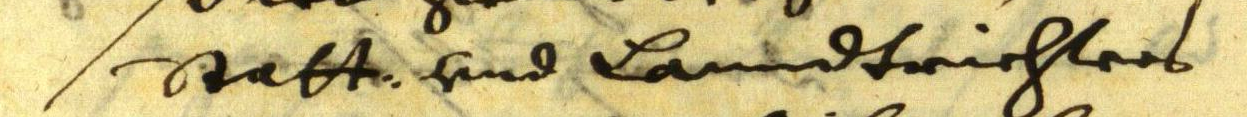Statt: vnd Lanndtrichters
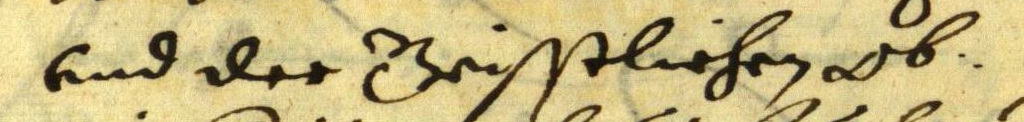vnd der Geisstlichen Ob¬
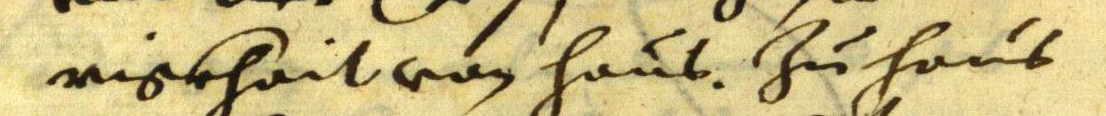rigkhait von haūs. Zū haūs
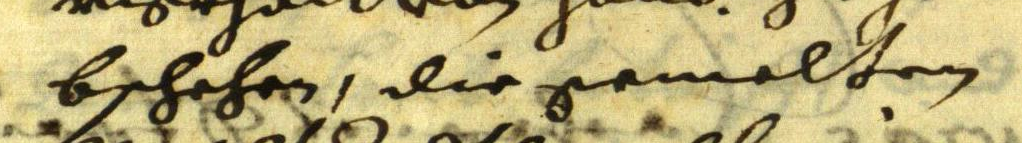bschehen, die gemelten
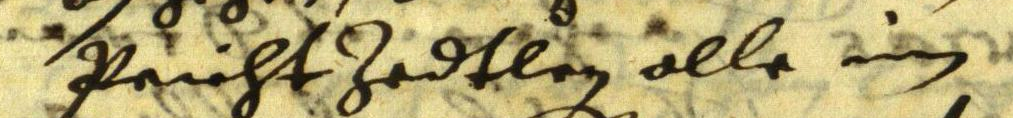Peicht Zedtlen alle im
